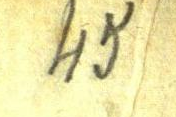45
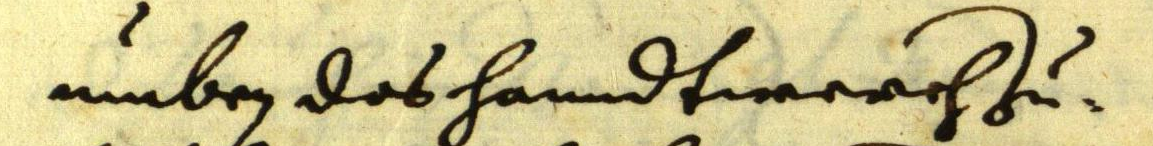ūmben das Hanndtwerch Zū¬
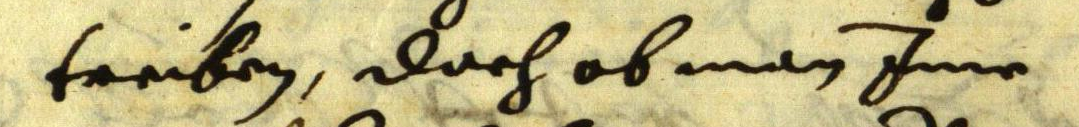treiben, doch ob man Ime
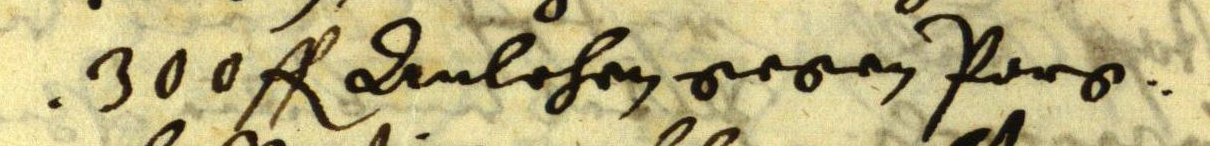.300 fl Anlehen gegen Porg¬
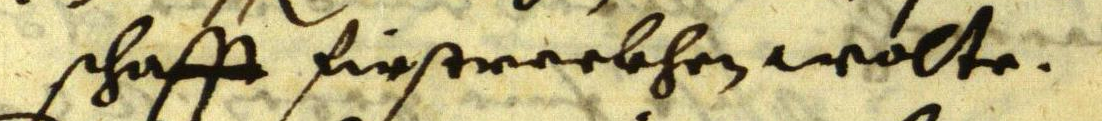schafft firstreckhen wolte.
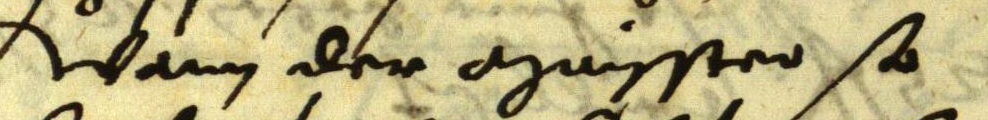Wann der Maisster so
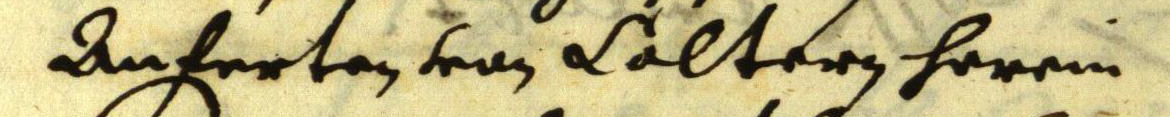Anferten von Caltern herein
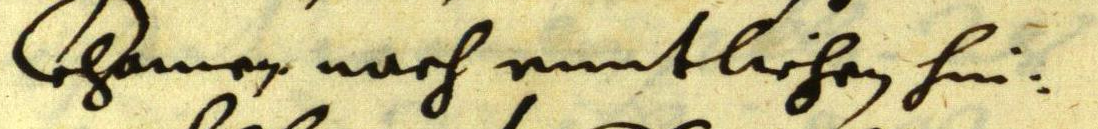Khomen nach enntlichen hin¬
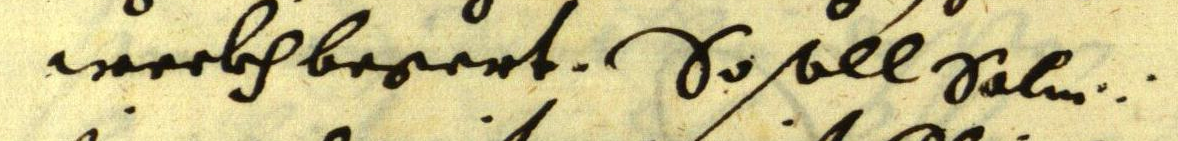weckh begert. So soll Salm¬
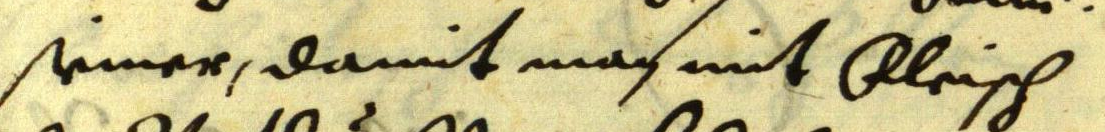steiner, damit man mit Fleisch
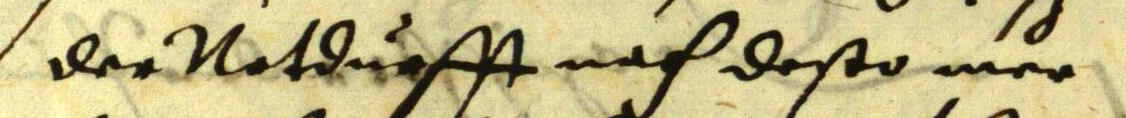der Notdūrfft nach desto mer
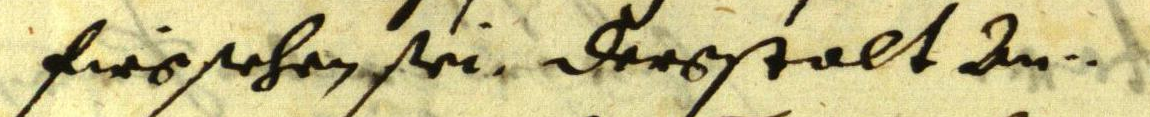firgsehen sei. dergstalt an¬
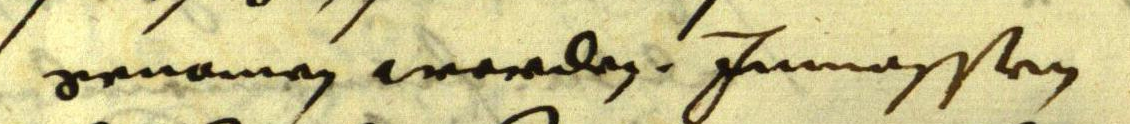genomen werden. Inmassen
